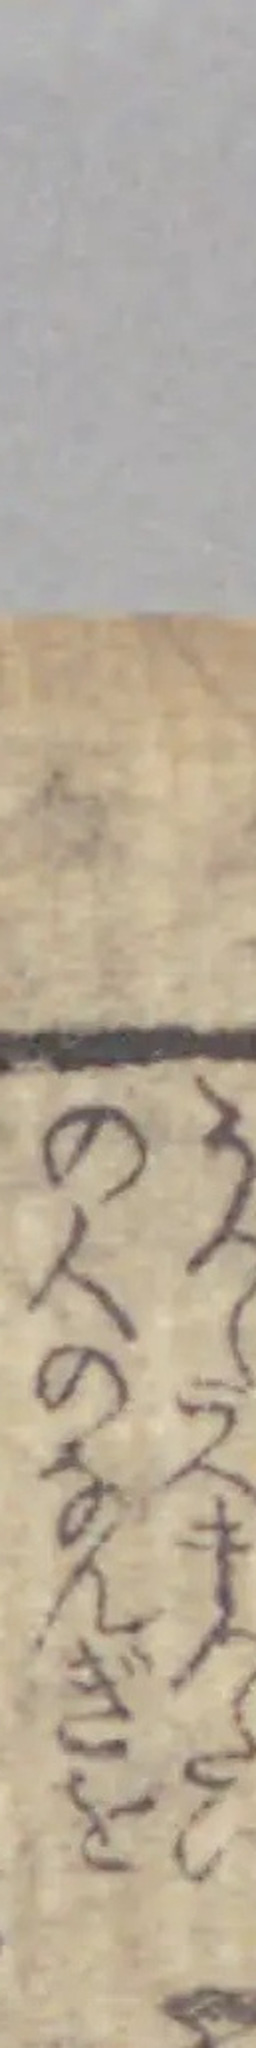の人のなんぎを
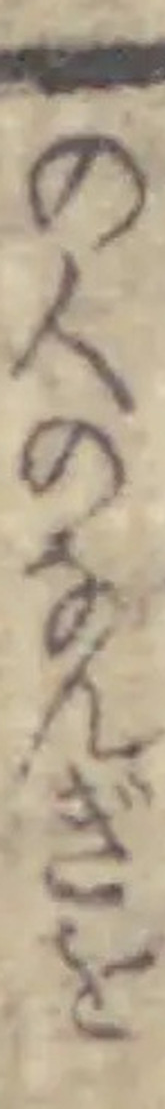の人のなんぎを
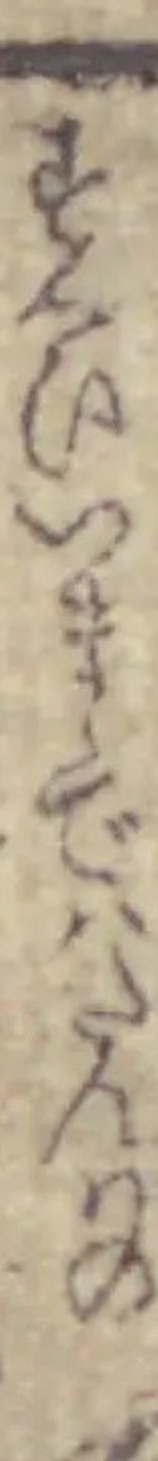すくひいまゝではたんばの
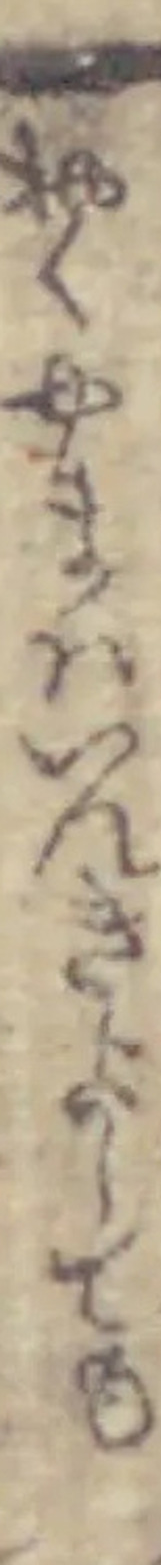おくやまはいんきよしても
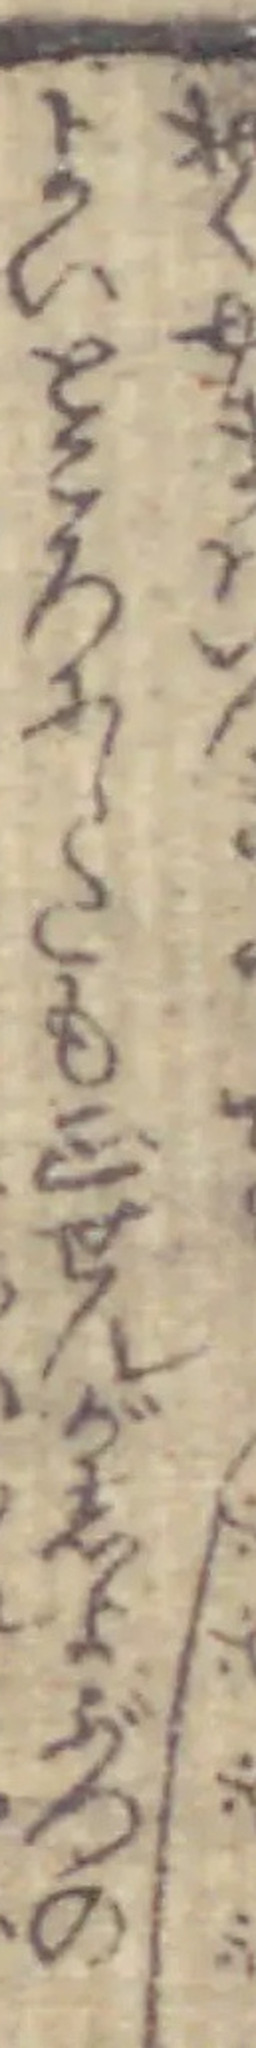よいところにしたも正せんがしよぶつの
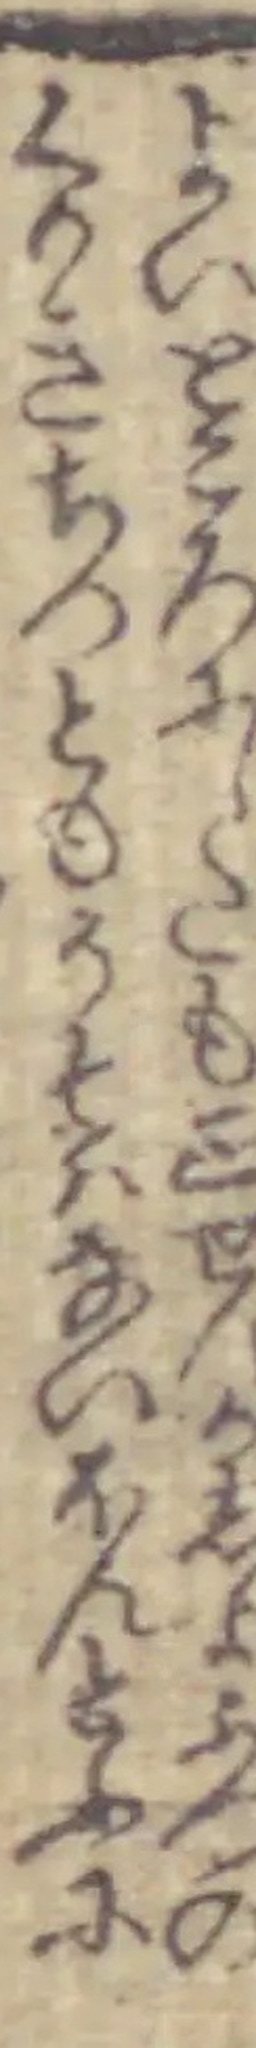くりきちつともうそはないほんとふに
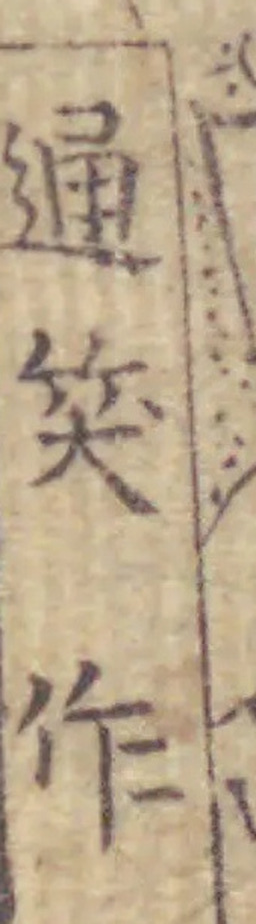通笑作
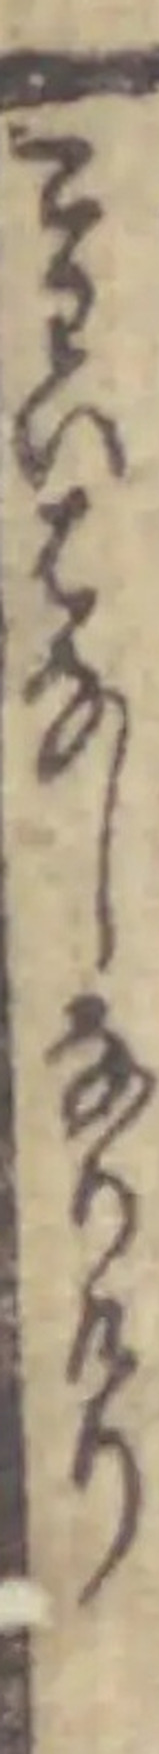こわいはなしなりけり
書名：もふもふもふ怖噺 2巻
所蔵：国立国会図書館 National Diet Library, JAPAN
